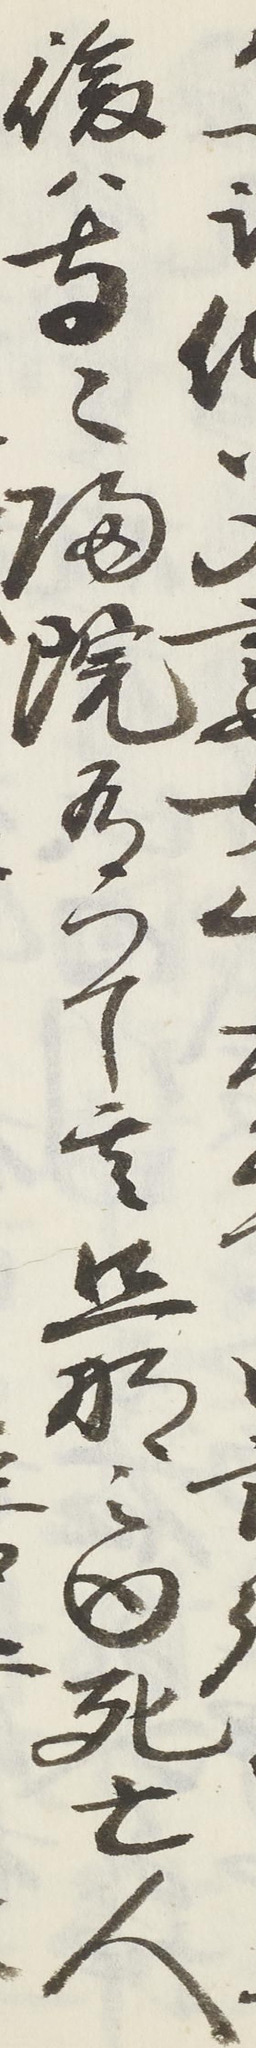後は寺々帰院有つて其旦那之内死亡人
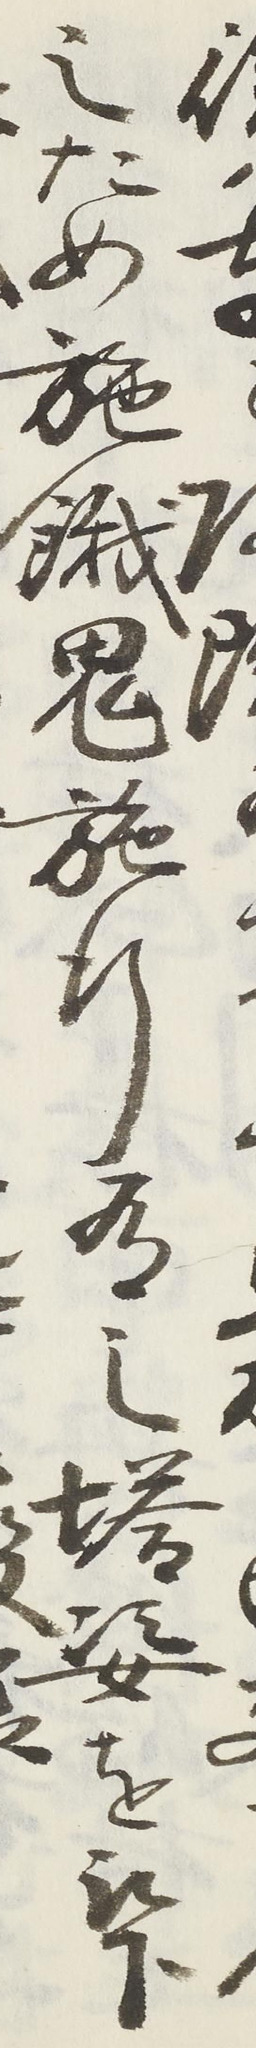之ため施餓鬼施行有之塔婆を被下
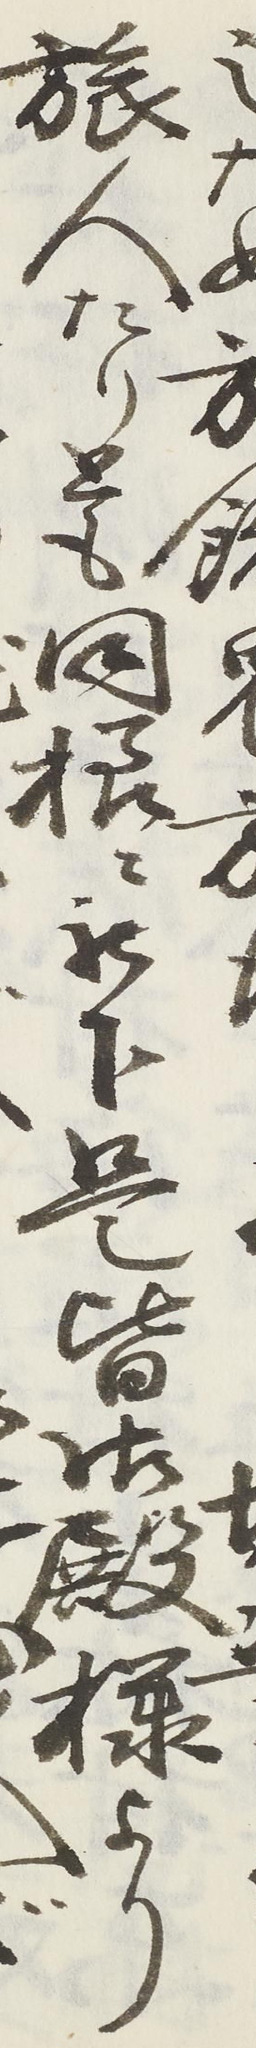旅人たりとも同様二被下是皆御殿様より
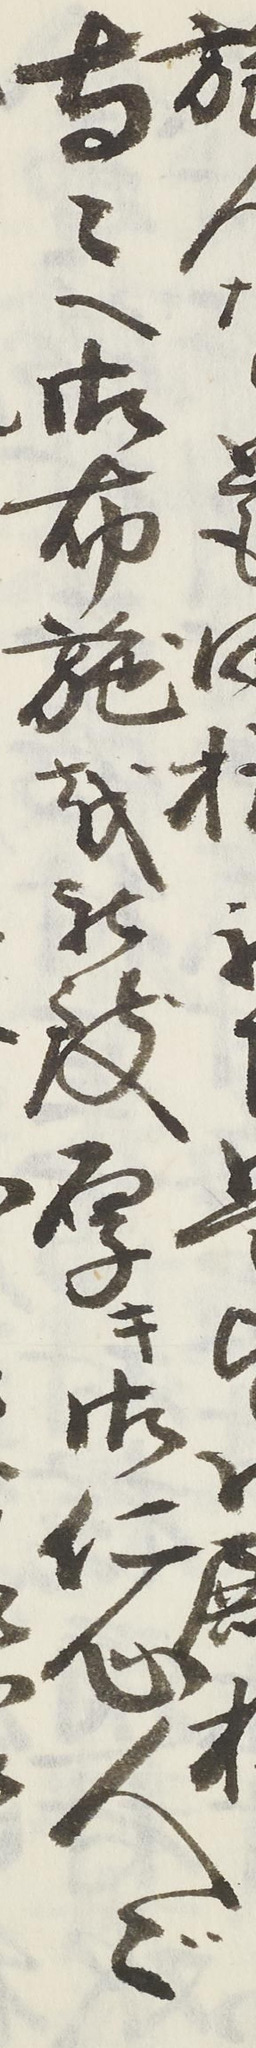寺々へ御布施を被致厚キ御仁心人々
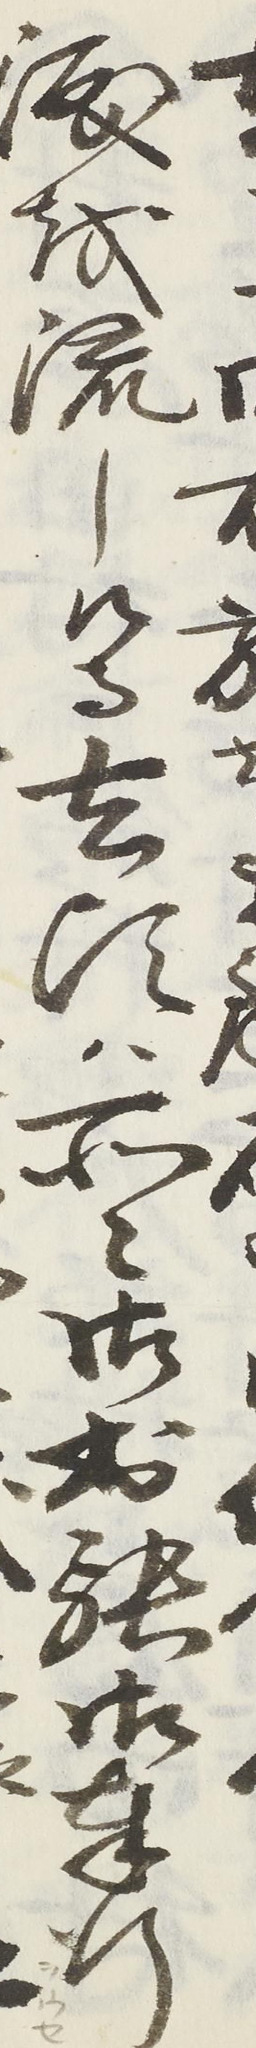涙を流しける去頃ハ所々御出張御奉行
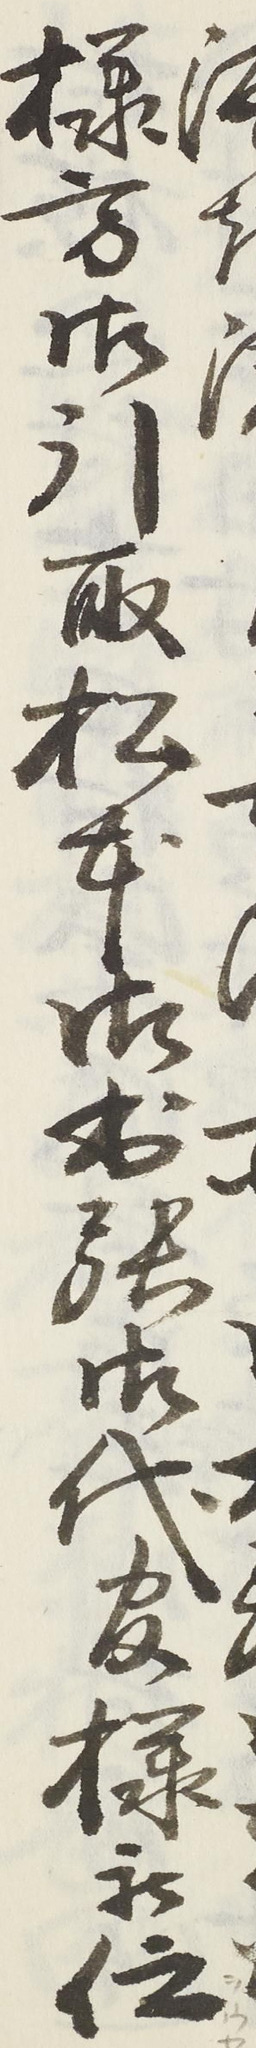様方御引取松本御出張御代官様被仰
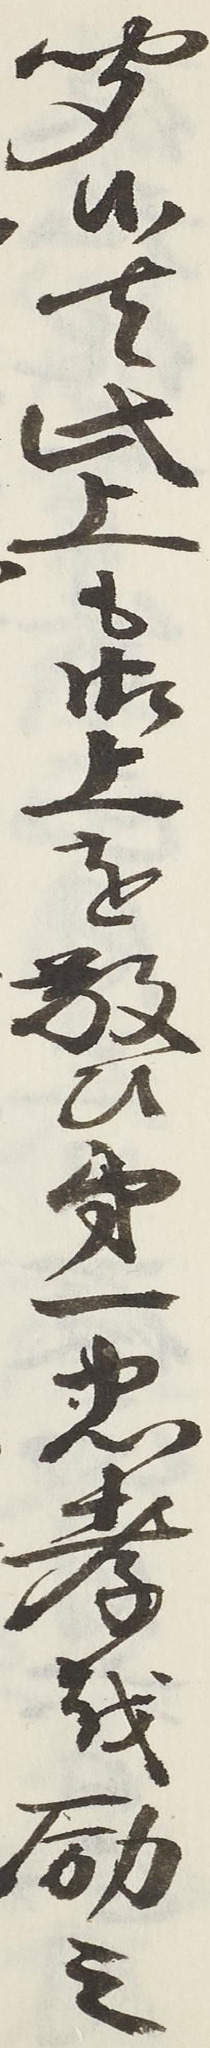聞候は此上も御上を敬ひ第一忠孝を励ミ
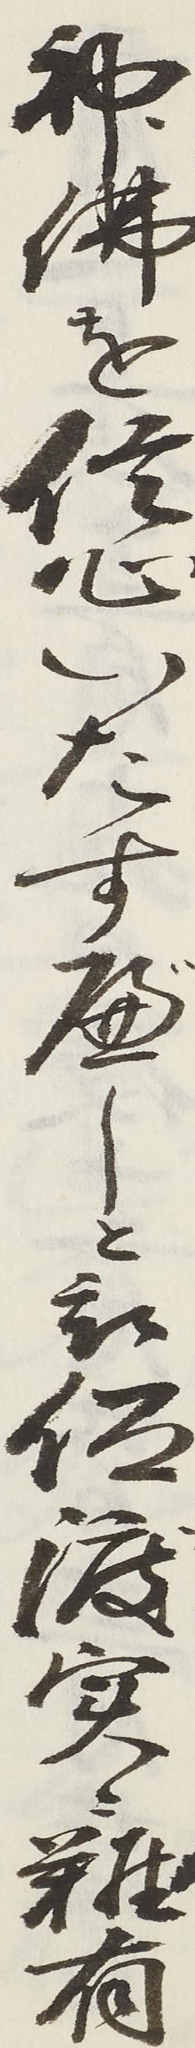神仏を信心いたすべしと被仰渡実二難有
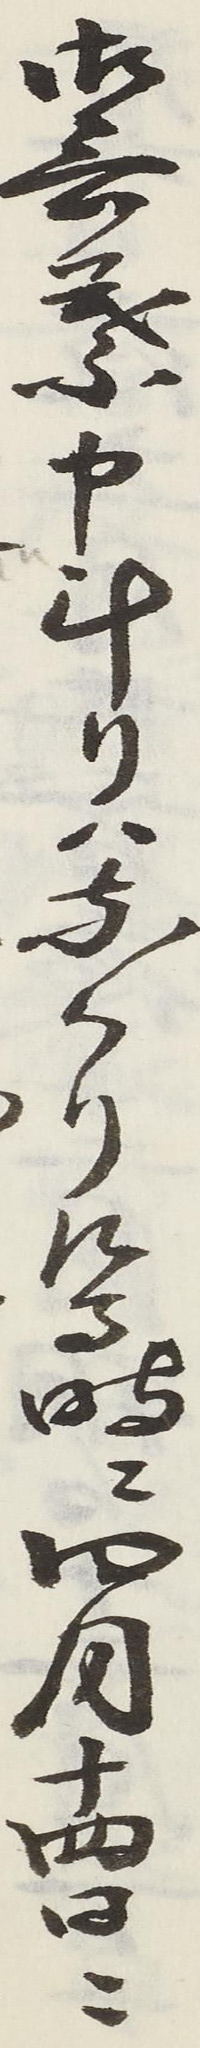御言葉申斗りハなかりける時二四月十四日二
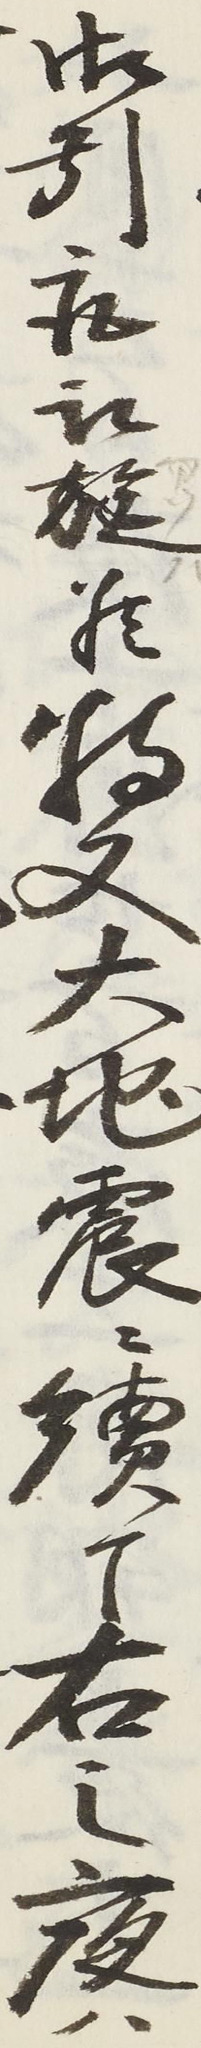御引取被遊候将又大地震二続て右之夜ハ
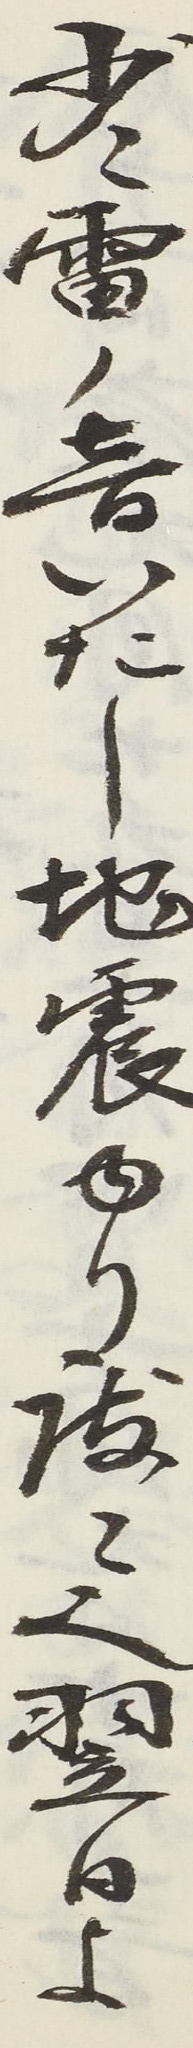少々雷ノ音いたし地震ゆり度々也翌日よ
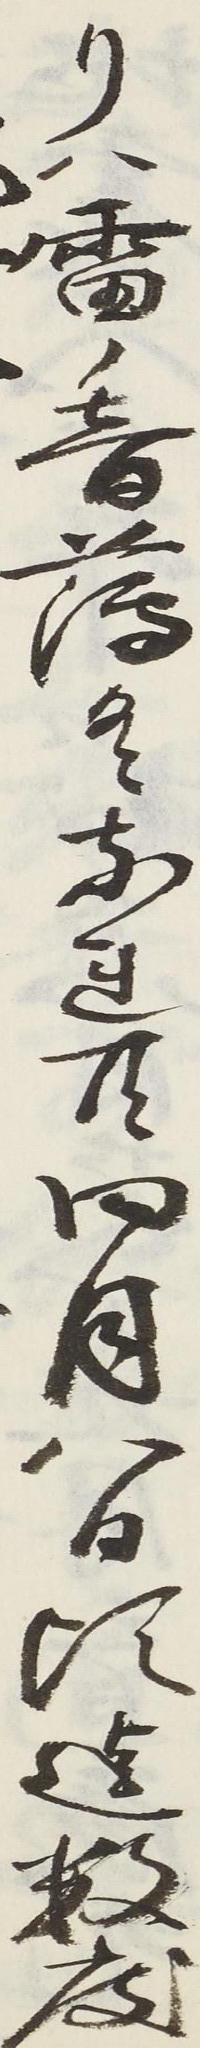りハ雷ノ音薄くなれ共四月八日頃迄数度
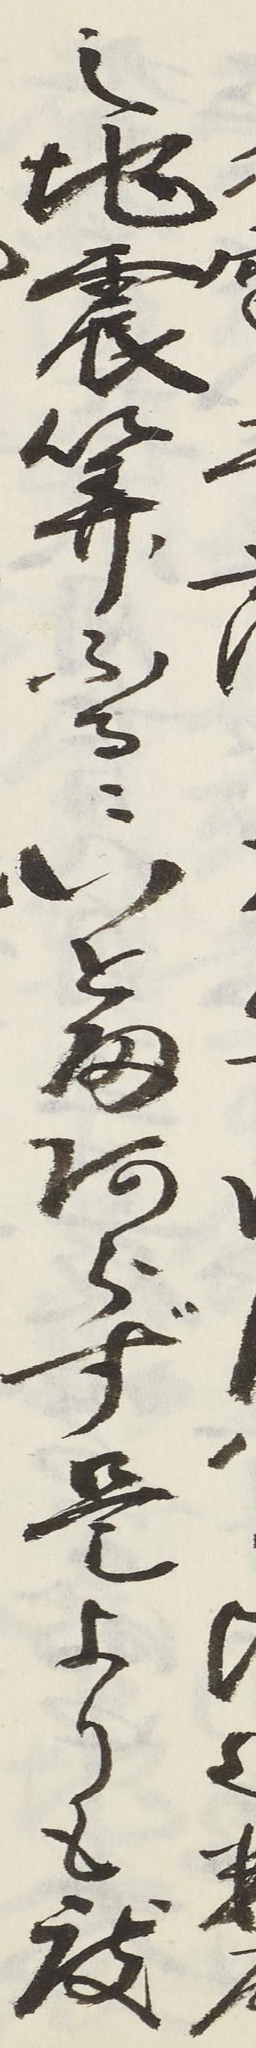之地震算ふる二いとまあらず是よりも度
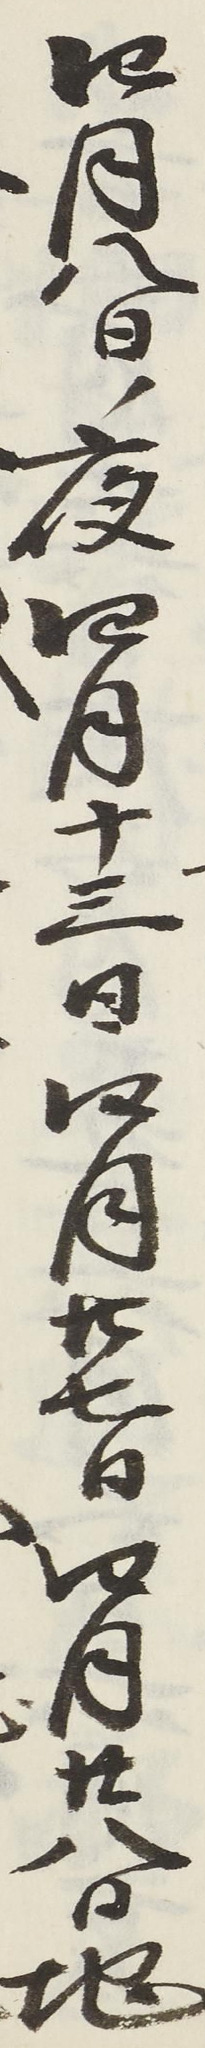四月八日ノ夜四月十三日四月廿七日四月廿八日地
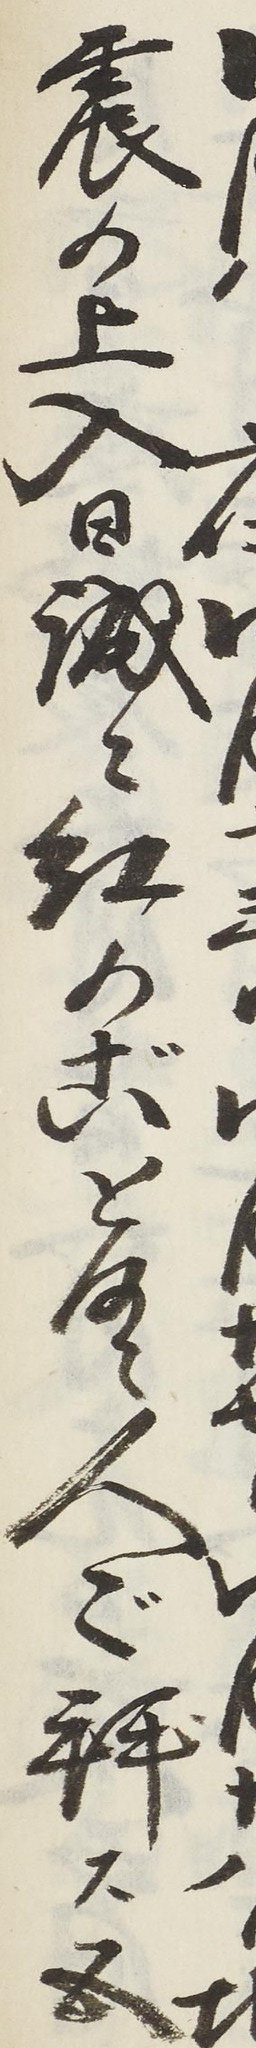震の上入日二紅のごとく人々評ㇲ五

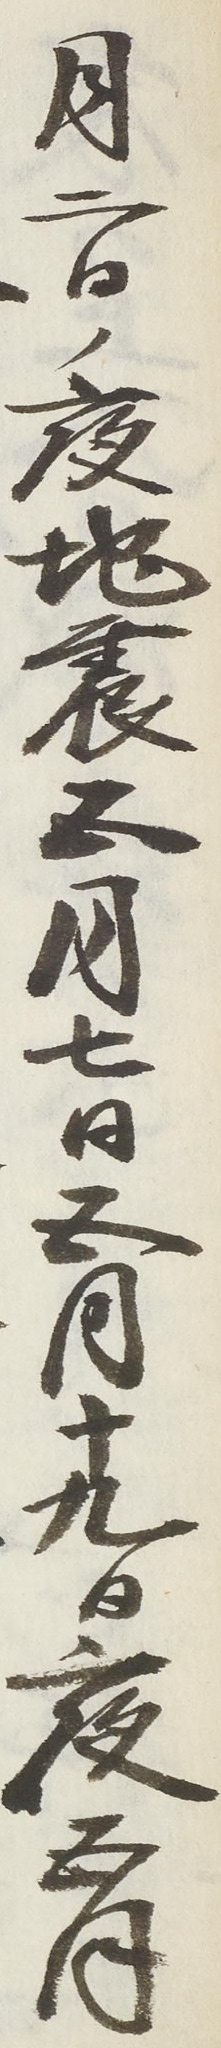月二日ノ夜地震五月七日五月十九日夜五月
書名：弘化四年地震記
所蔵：東京大学地震研究所図書室 Earthquake Research Institute Library, The University of Tokyo, JAPAN
